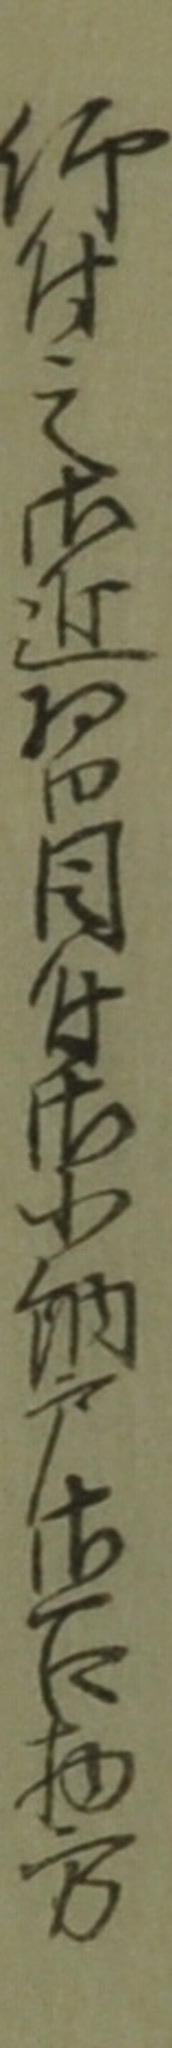仰付之御近習目付御小納戸御召物方
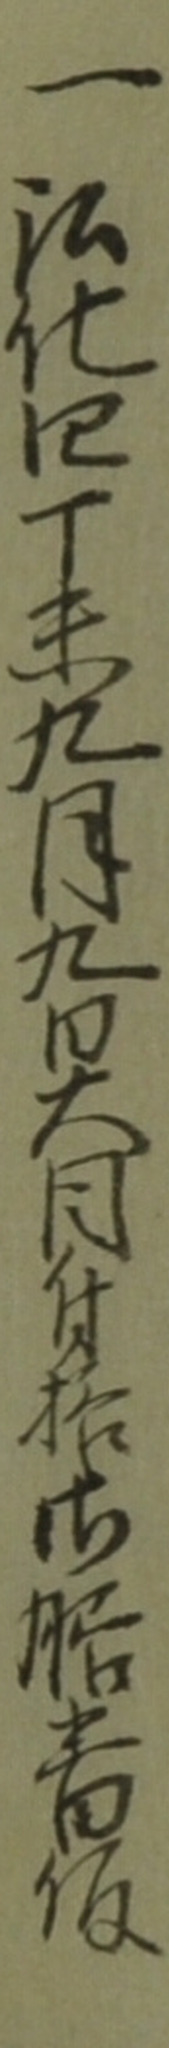一弘化四丁未九月九日大目付格御膳番仮
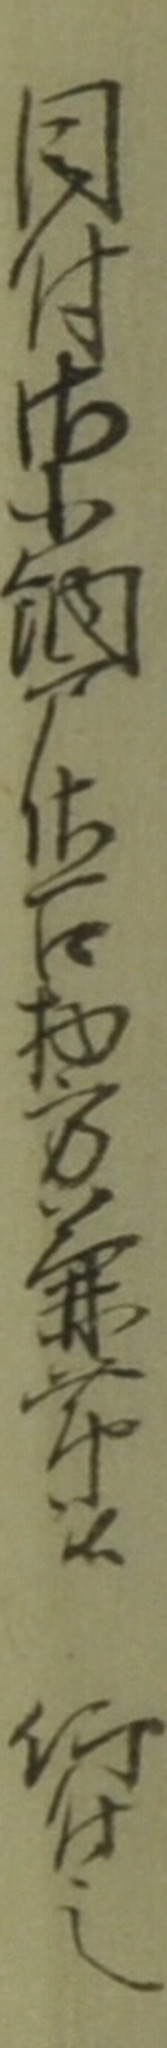目付御小納戸御召物方兼帯被仰付之
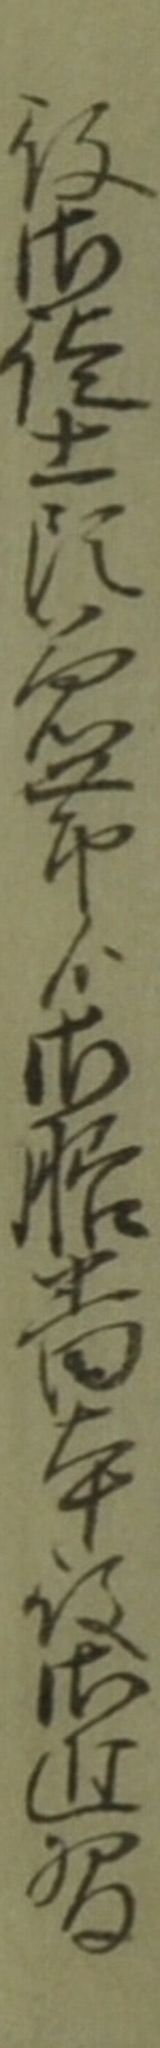役御徒士頭兼帯ゟ御膳番本役御近習

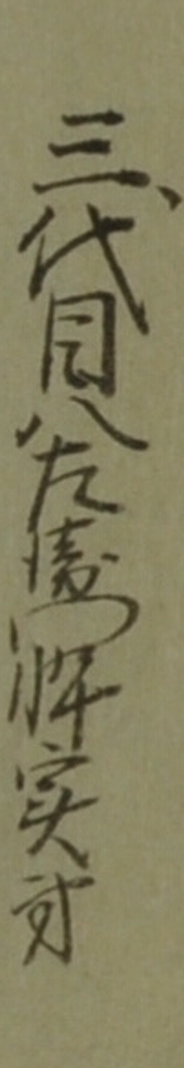三代目八左衛門実弟
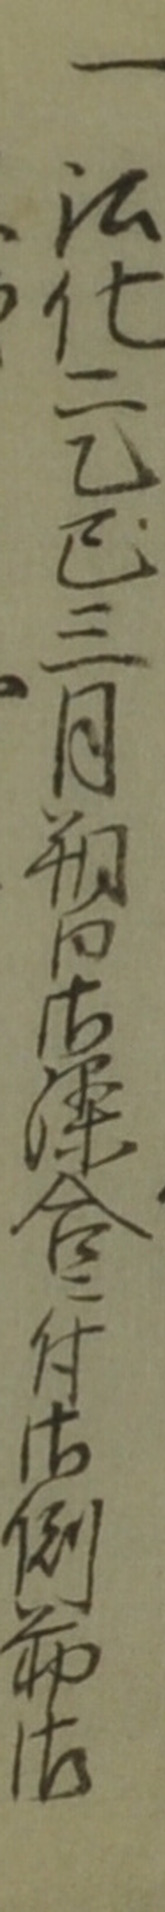一弘化二乙巳三月朔日御繰合ニ付御側勤御
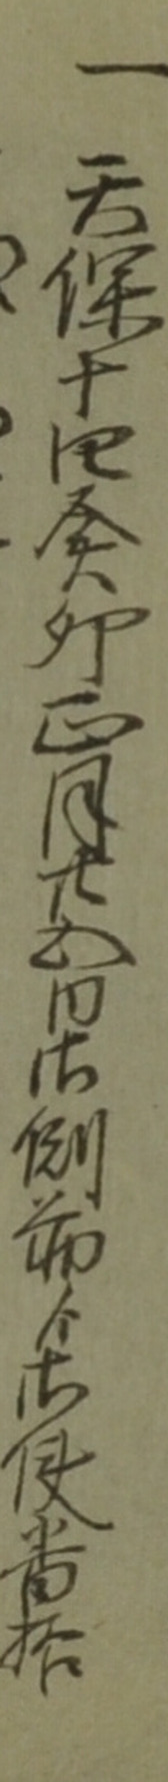一天保十四癸卯正月廿五日御側勤ゟ御使番格
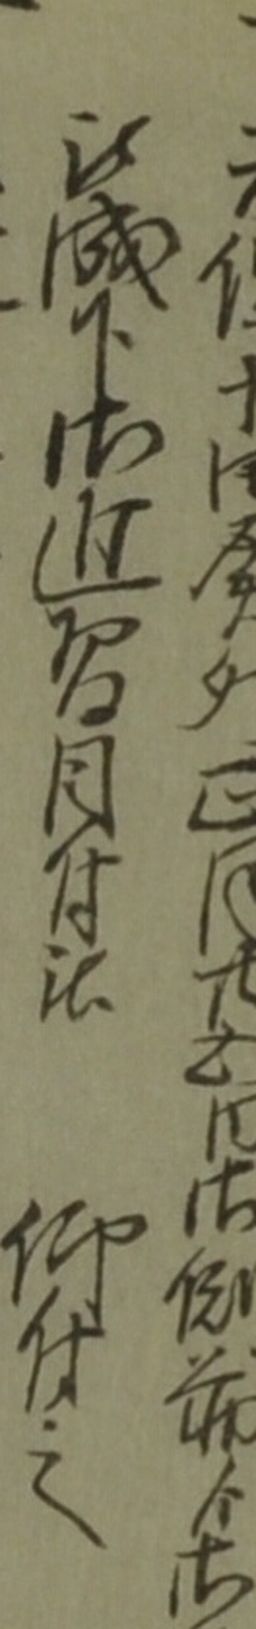被成下御近習目付被仰付之
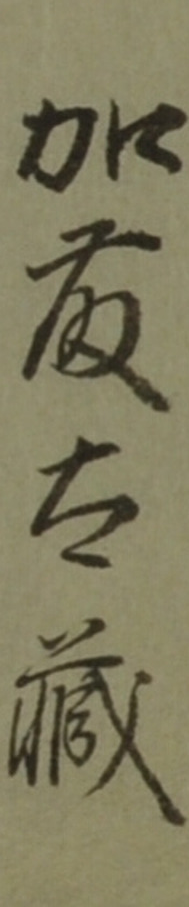加藤太蔵
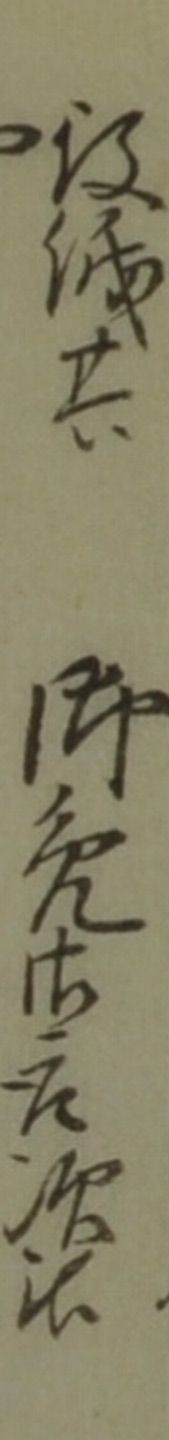役儀共御免御取次被
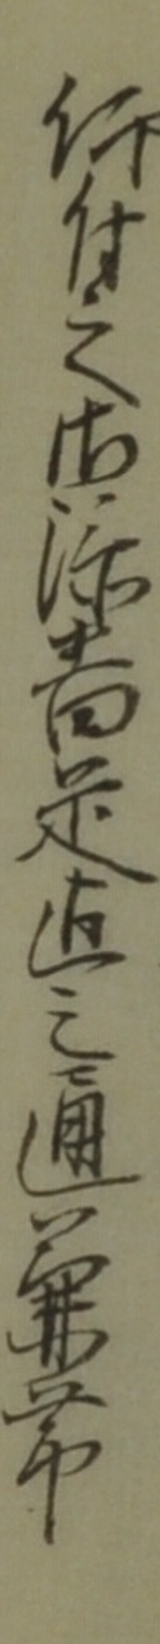仰付之御添番是迄之通兼帯
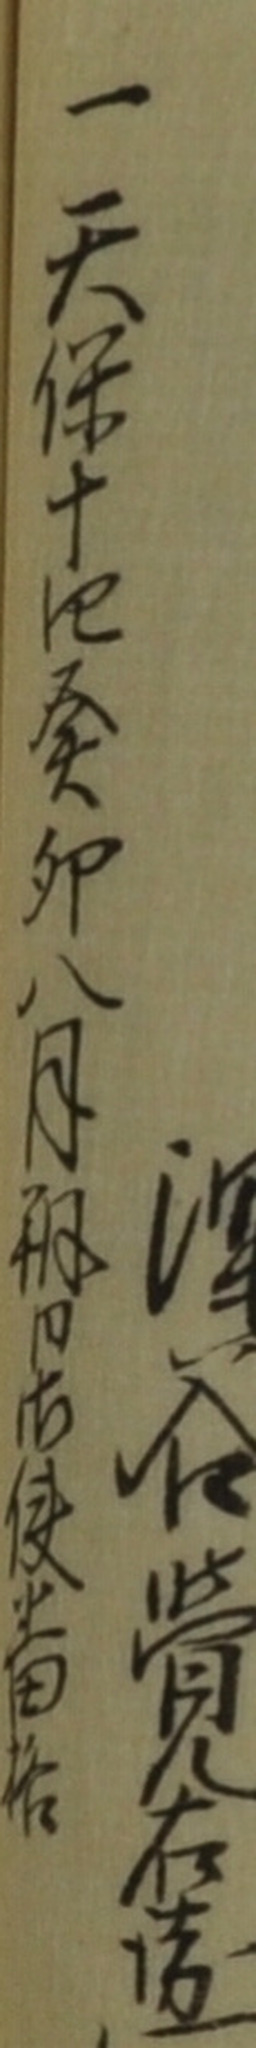一天保十四癸卯八月朔日御使番格
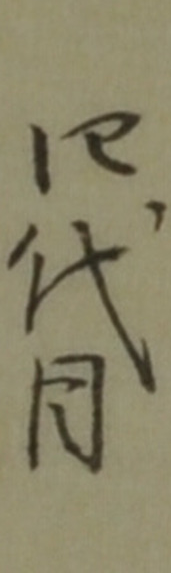四代目
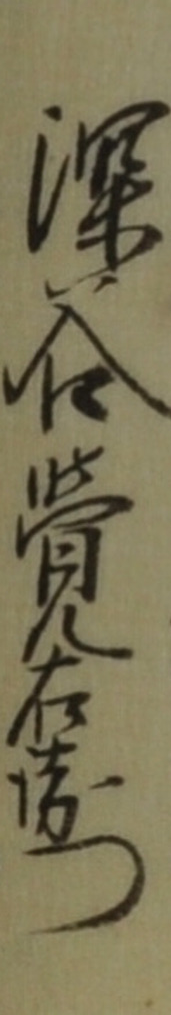深谷覚右衛門
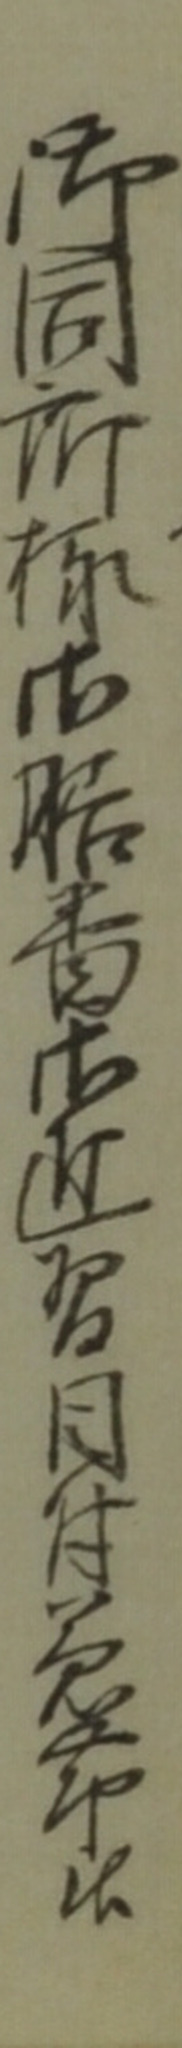御同所様御膳番御近習目付兼帯被
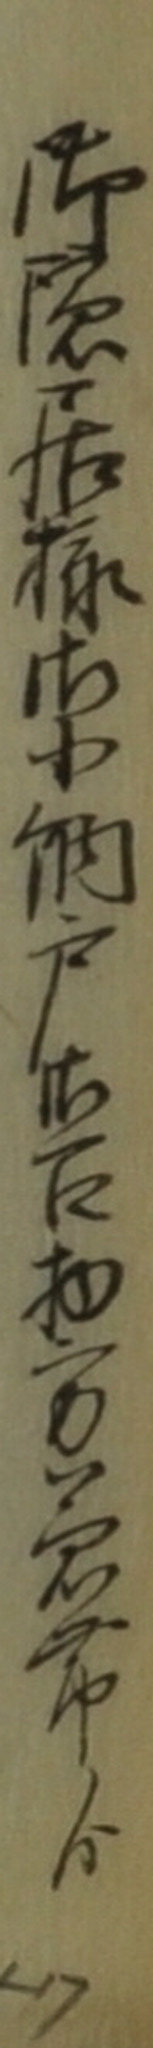御隠居様御小納戸御召物方兼帯ゟ
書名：諸御役代々録（四）
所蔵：伊那市立高遠町図書館・合同会社AMANE
